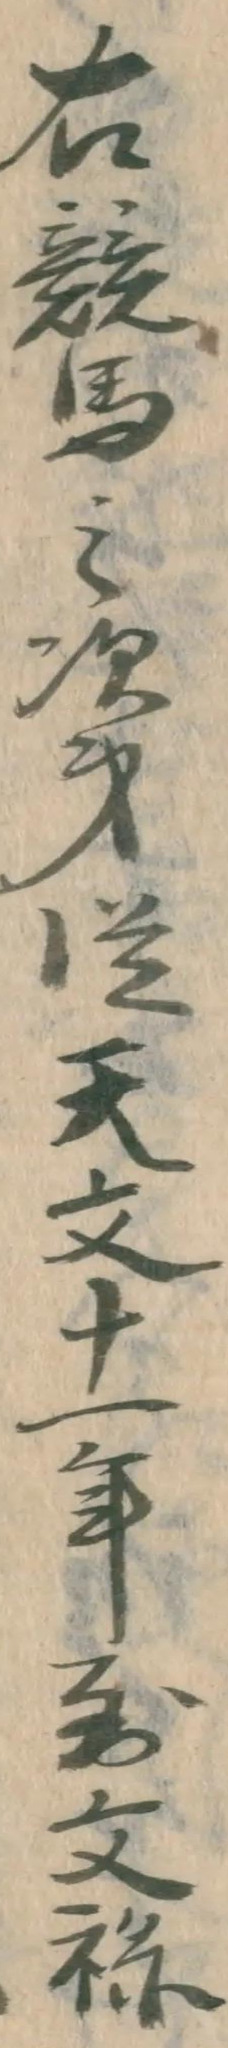右競馬之次第従天文十一年到文禄
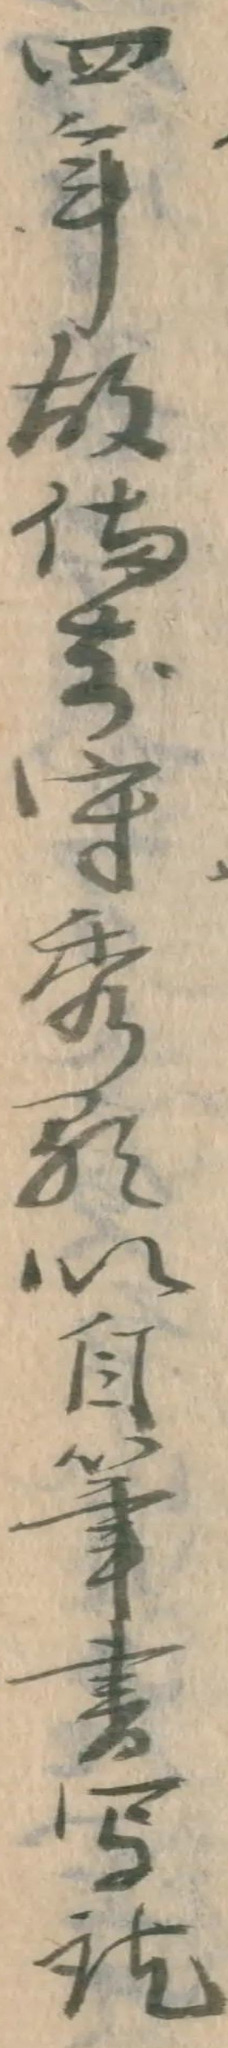四年故備前守秀顕以自筆書写訖
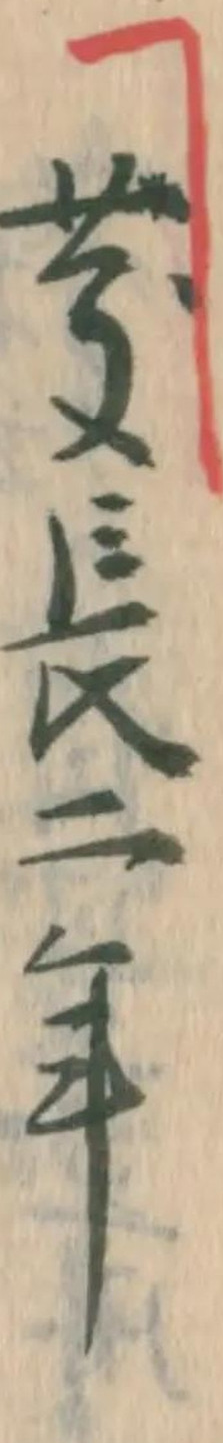慶長二年
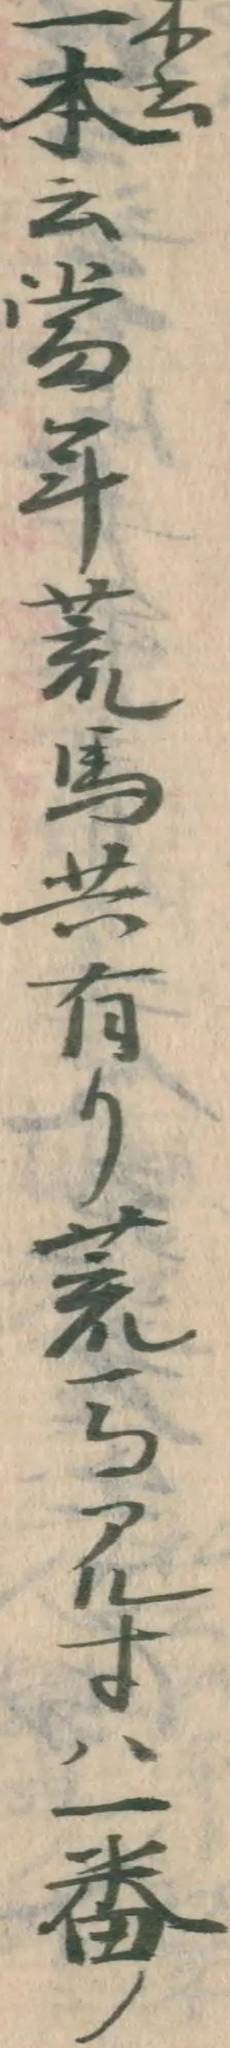一本云当年荒馬共有リ荒馬アル時ハ一番ノ
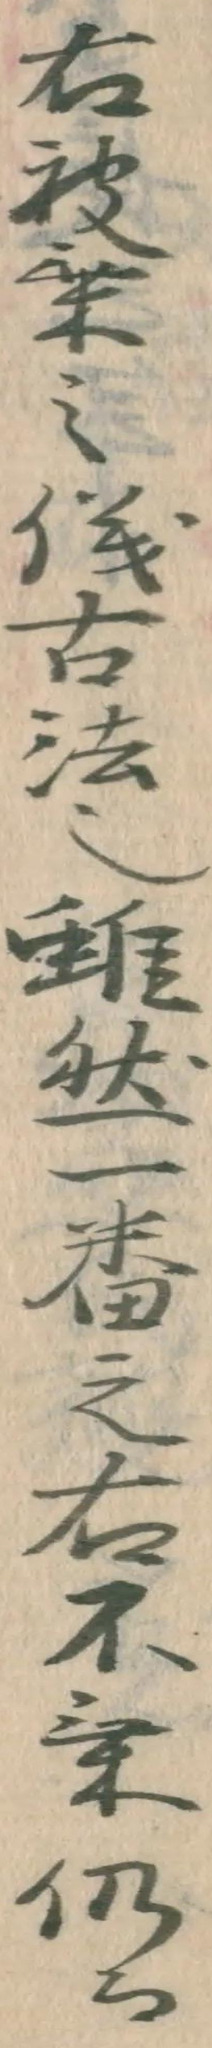右被乗之儀古法也雖然一番之右不乗仍而
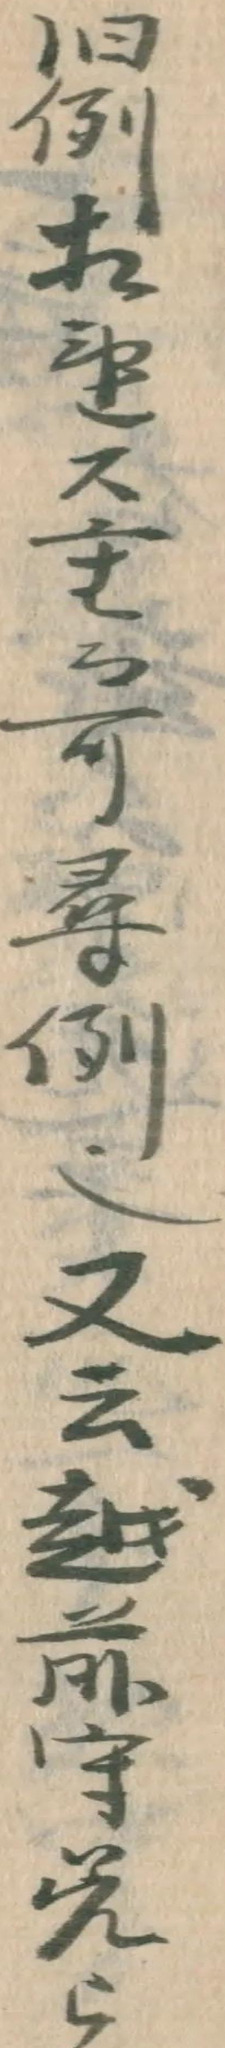旧例相速ス重而可尋例也又云越前守差被
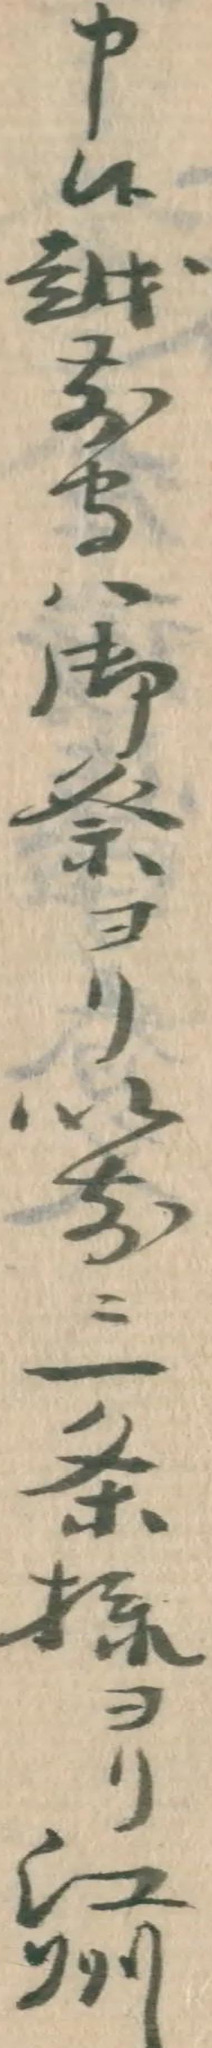申候越前守ハ御祭ヨリ以前ニ一条様ヨリ江州
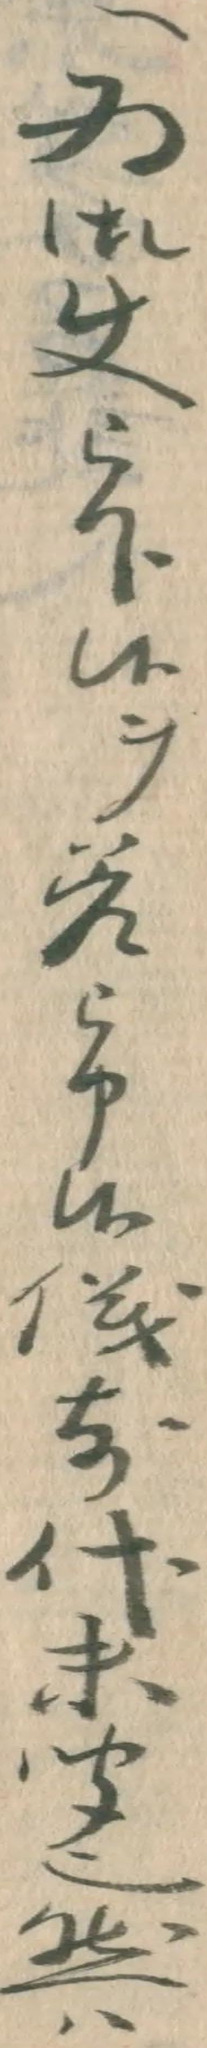へ為御使被下候ヲ差被申候儀前代未聞也然ハ
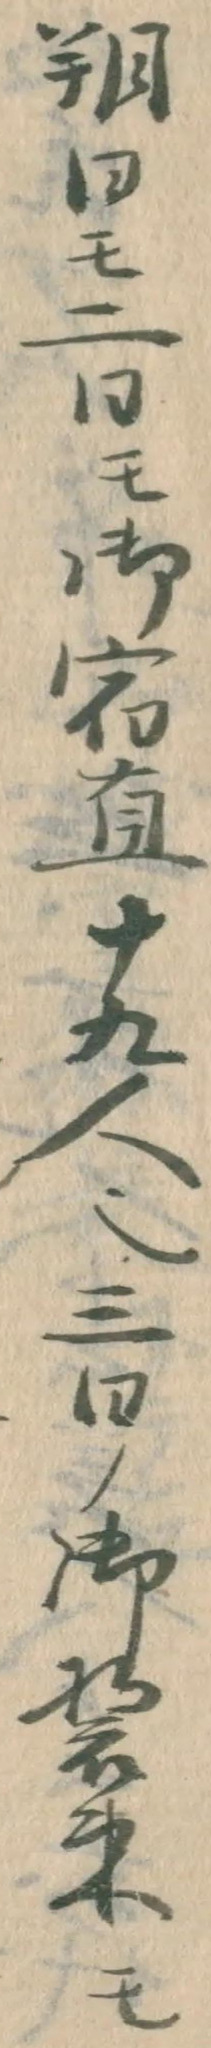朔日モ二日モ御宿直十九人也三日ノ御装束モ
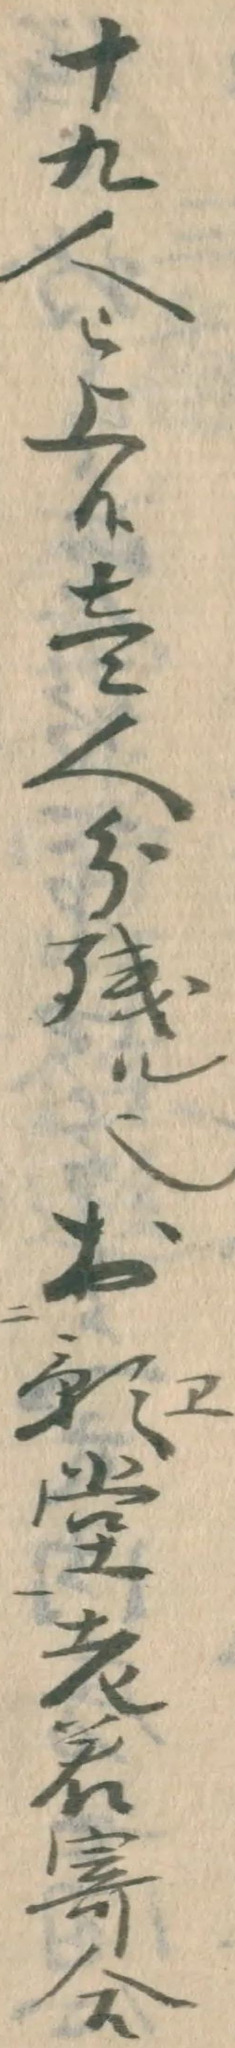十九人被上候壱人分残ル也於影堂老若寄合
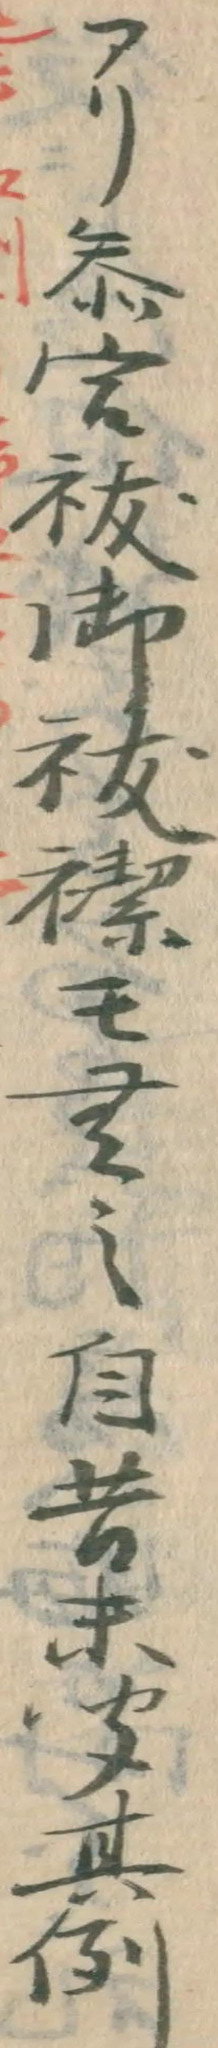アリ参宮祓御祓襟モ無之自昔未聞其例
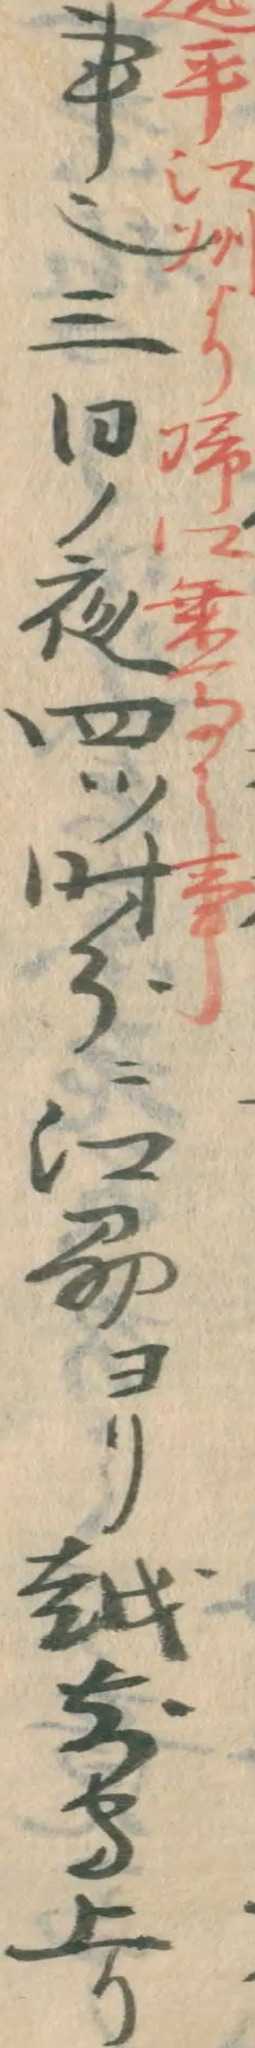事也三日ノ夜四ツ時分ニ江州ヨリ越前守上リ

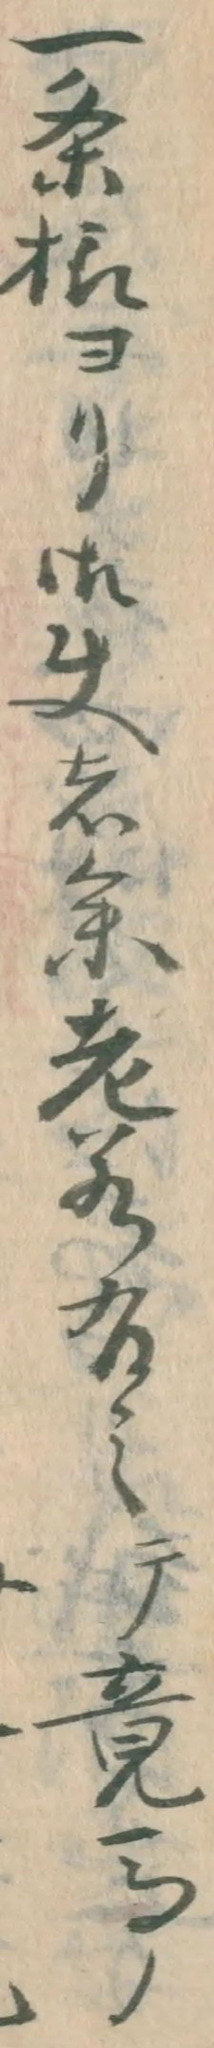一条様ヨリ御使者参老若有之テ競馬ノ
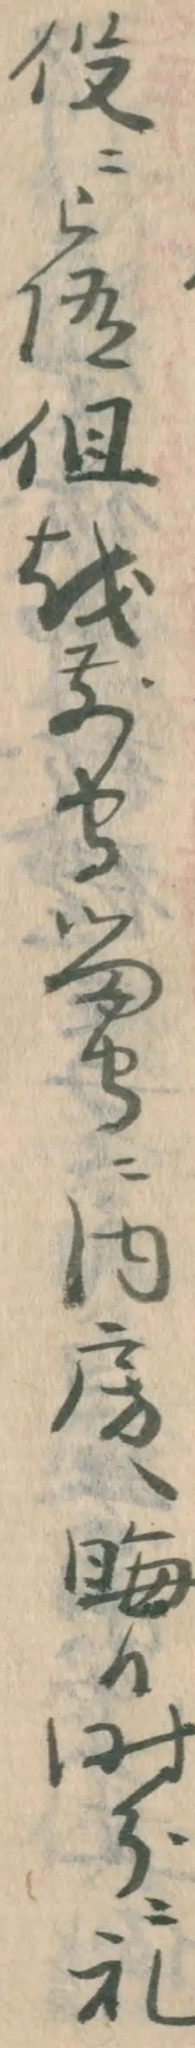役ニ被随但越前守留守ニ内房へ晦日時分ニ礼
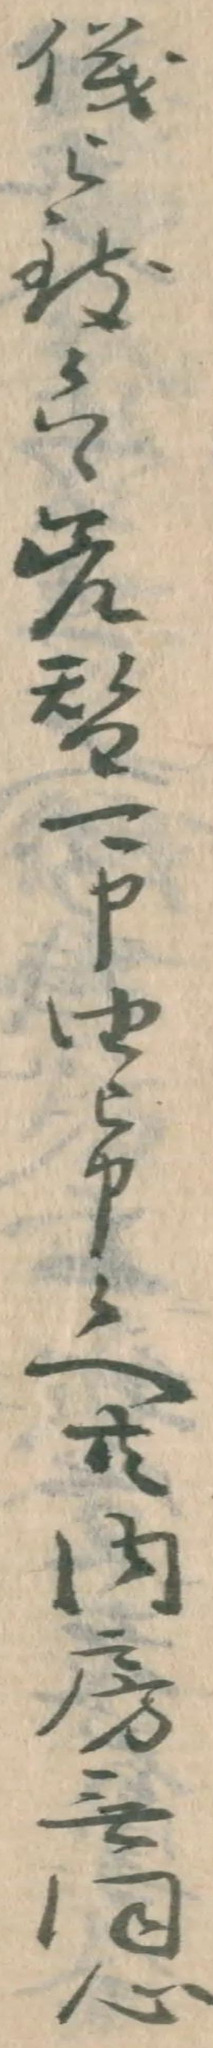儀被致候ハヽ差替可申由被申候へ共内房無同心
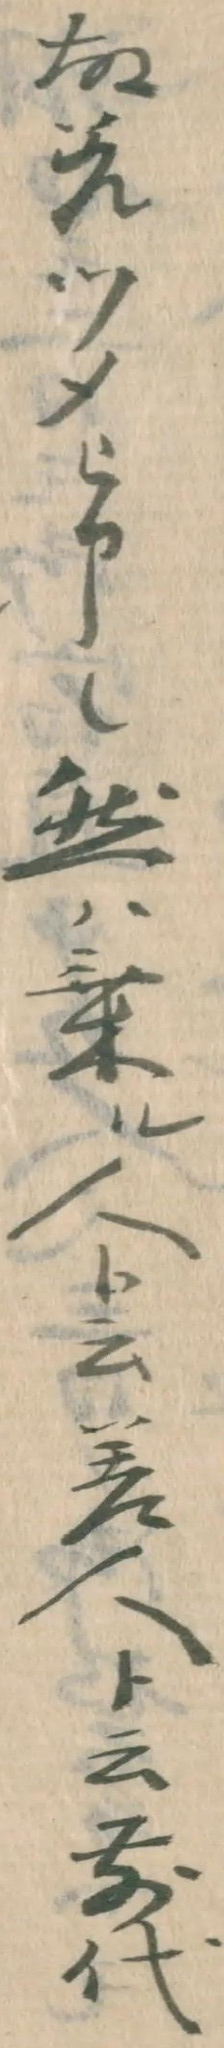故差ツメ被申候然ハ乗ル人ト云差人ト云前代
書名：賀茂社記録. 第10冊
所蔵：国立国会図書館 National Diet Library, JAPAN
